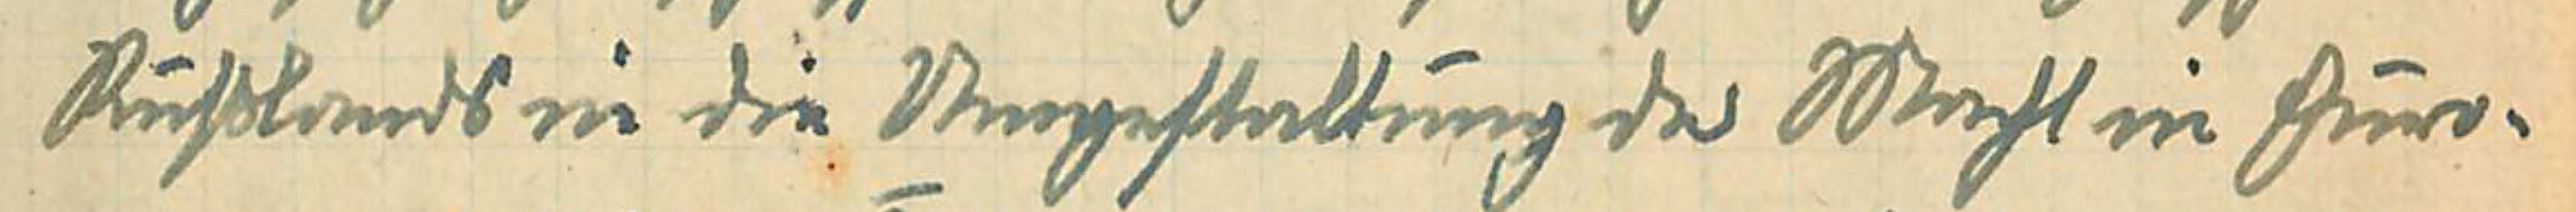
Rußlands in die Umgestaltung der Macht in Euro-
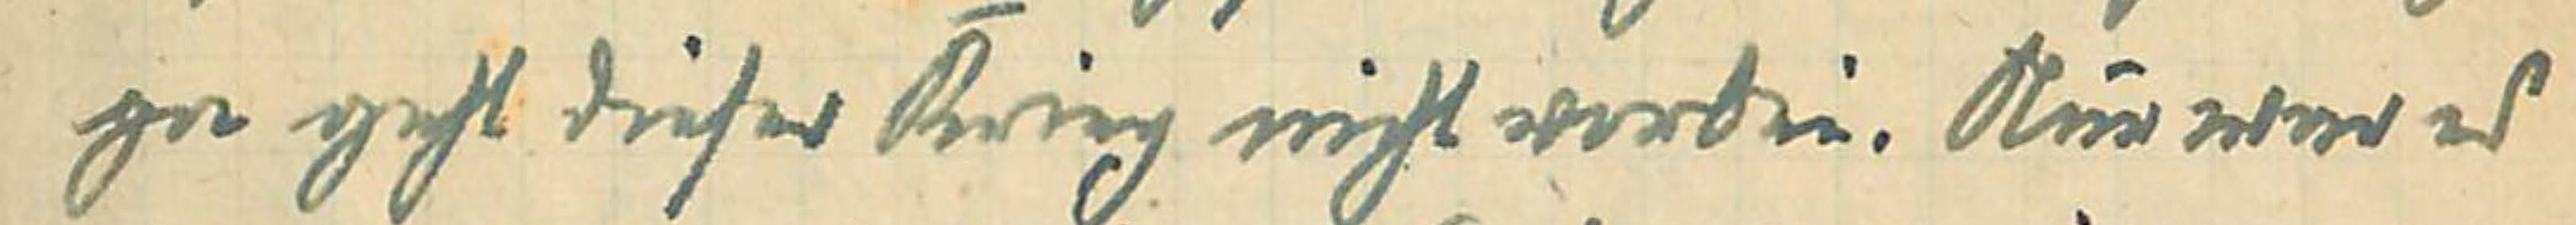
pa geht dieser Krieg nicht vorbei. Nur war es
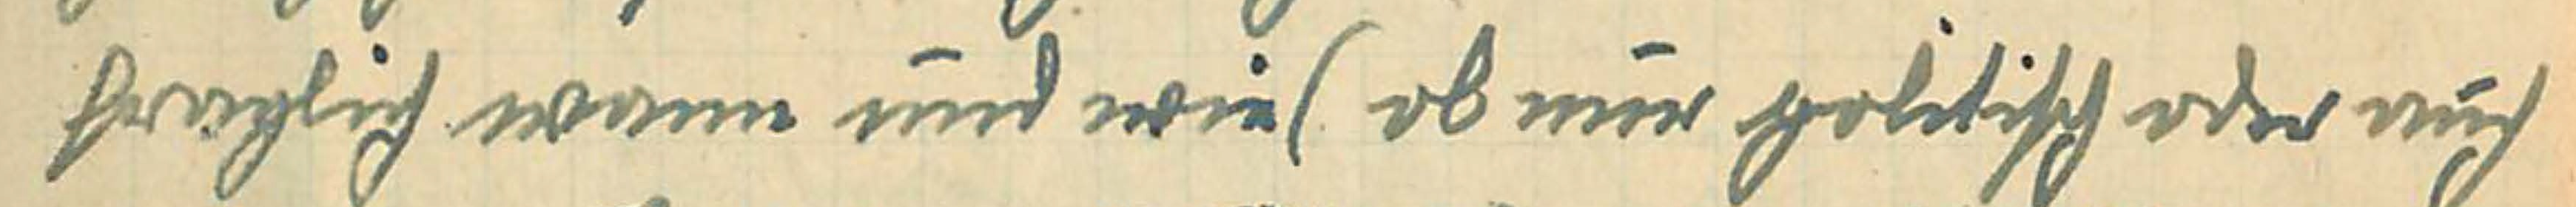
fraglich wann und wie (ob nur politisch oder auch
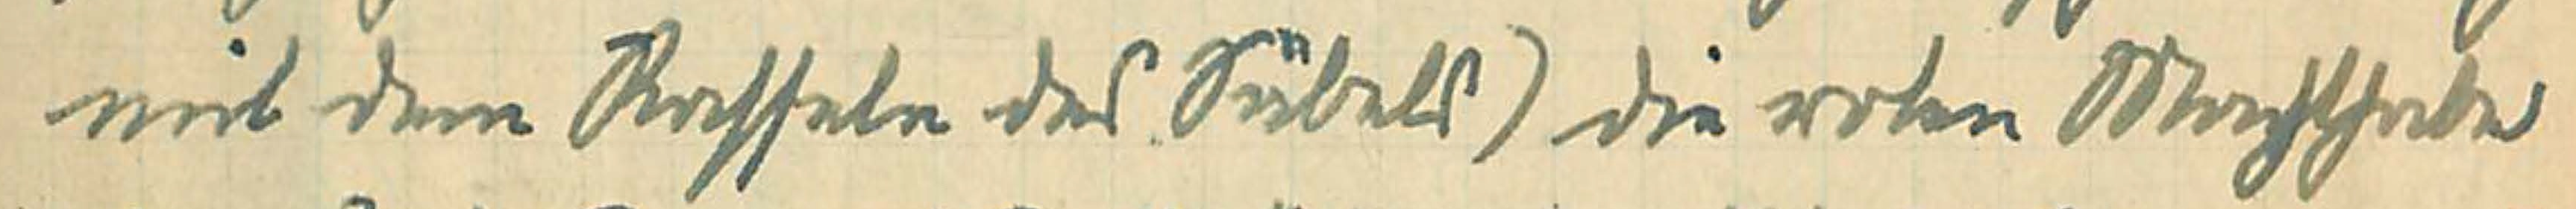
mit dem Rasseln des Säbels) die roten Machthaber
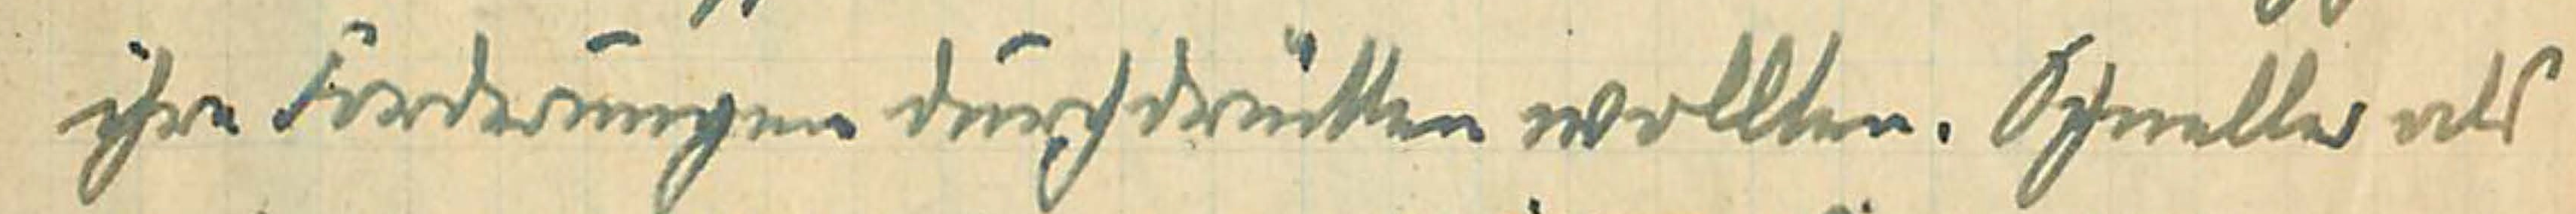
ihre Forderungen durchdrücken wollten. Schneller als
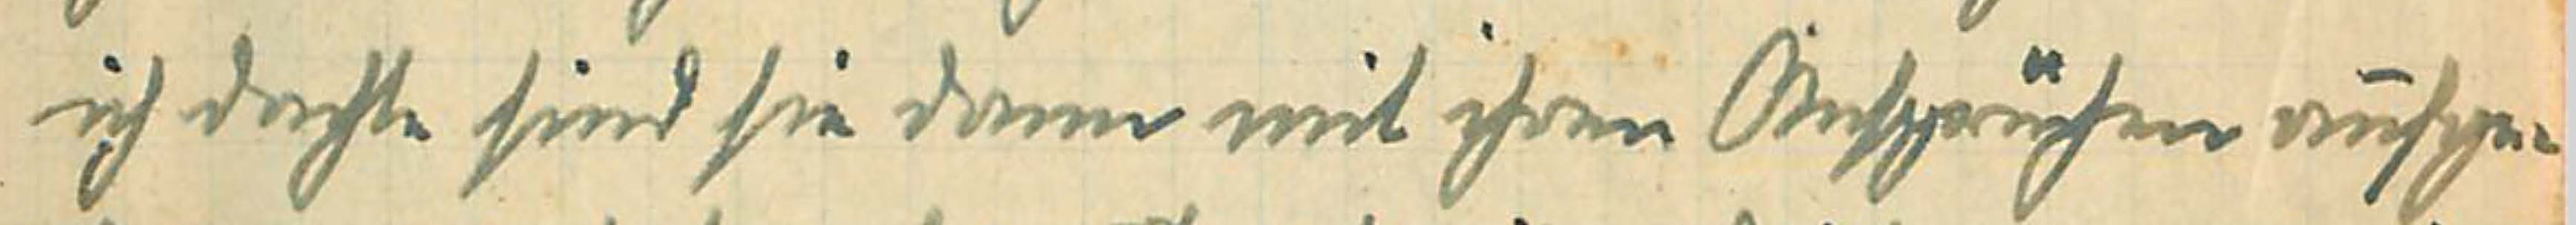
ich dachte sind sie dann mit ihren Ansprüchen aufge-
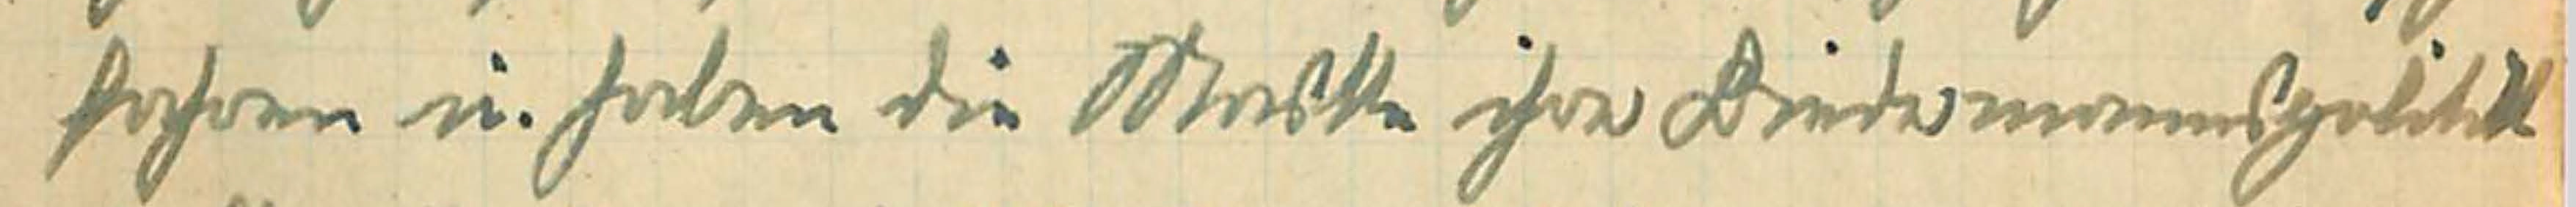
fahren u. haben die Maske ihrer Biedermannspolitik
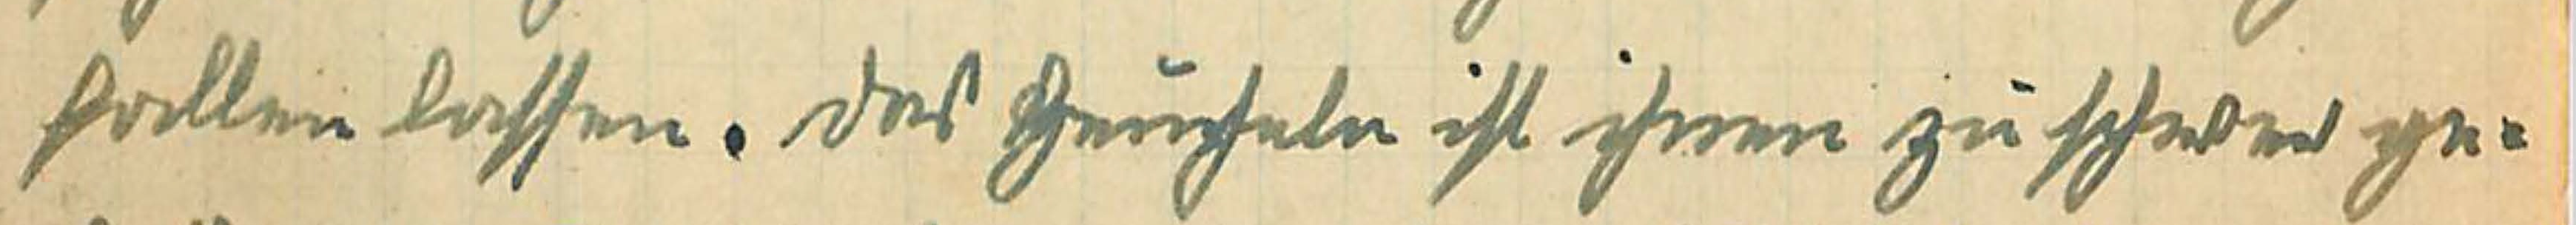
fallen lassen. Das Heucheln ist ihnen zu schwer ge-
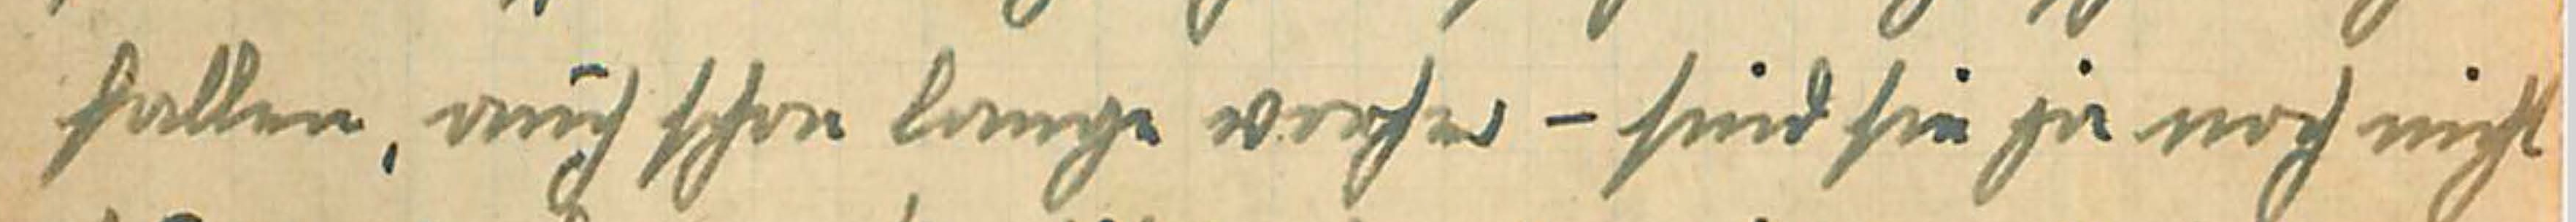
fallen, auch schon lange vorher – sind sie ja noch nicht
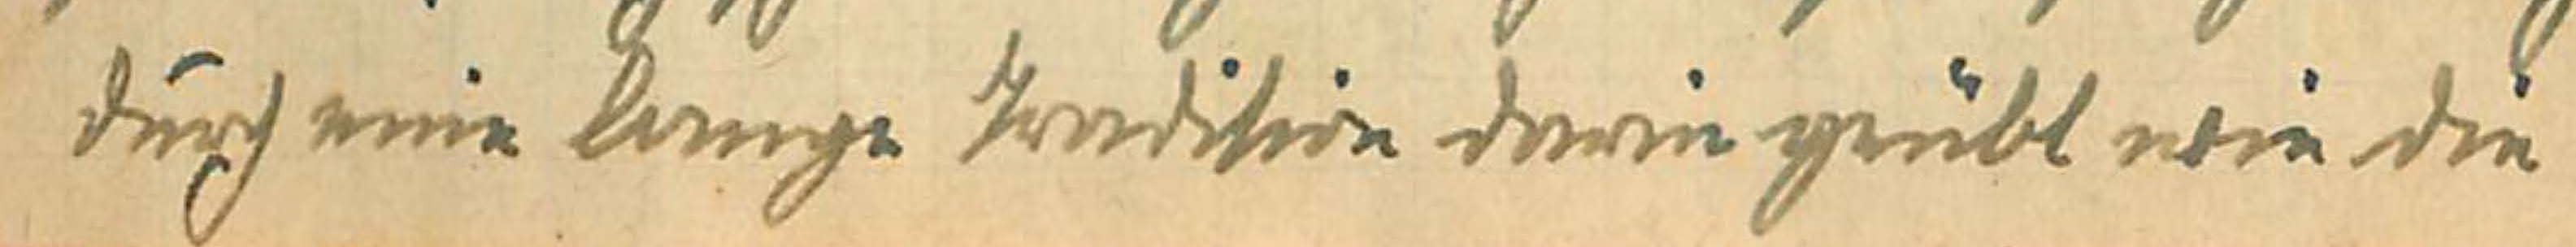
durch eine lange Tradition darin geübt wie die
